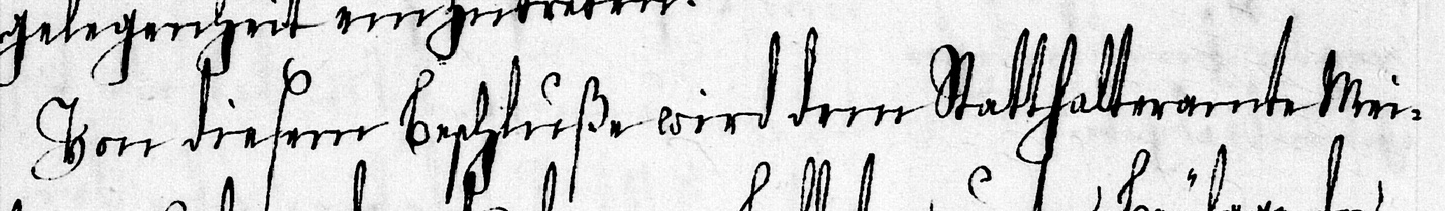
Von diesem Beschluße wird dem Statthalteramte Mei¬
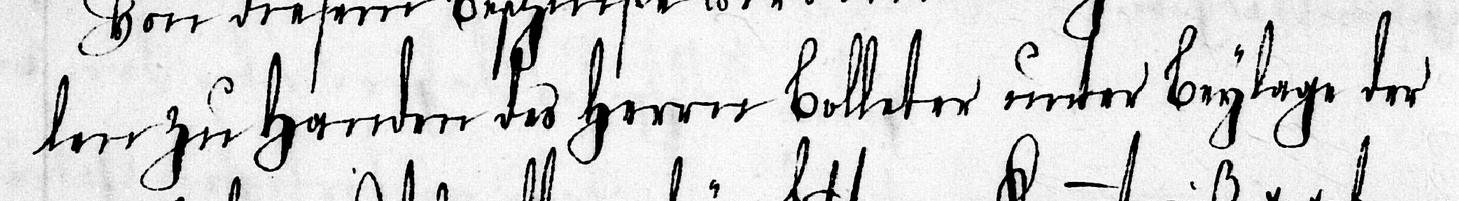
len zu Handen des Herrn Bolleter unter Beylage der
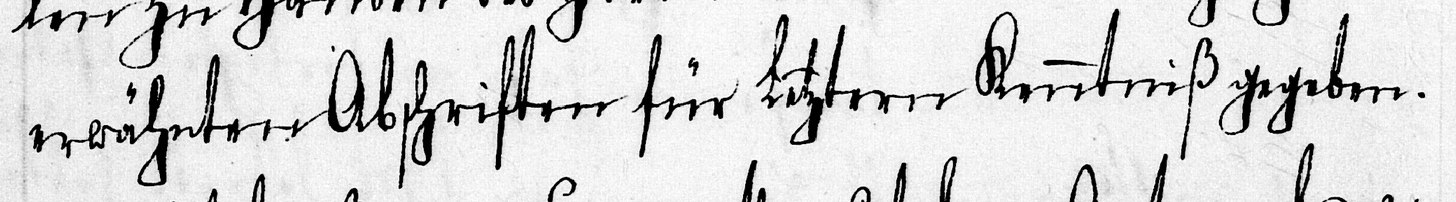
erwähnten Abschriften für Letztern Kenntniß gegeben.
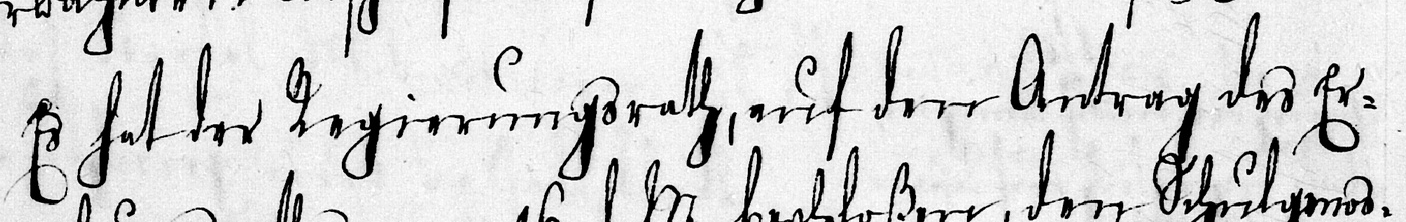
Es hat der Regierungsrath, auf den Antrag des Er¬
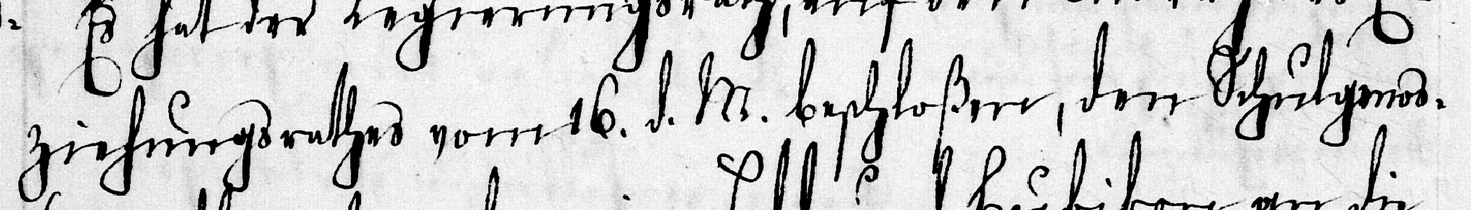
ziehungsrathes vom 16. d. M. beschloßen, den Schulgenoß¬
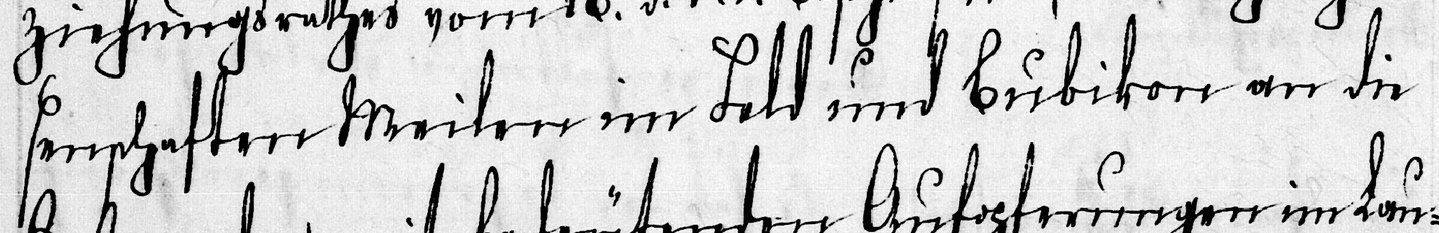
enschaften Meilen im Feld und Bubikon an die
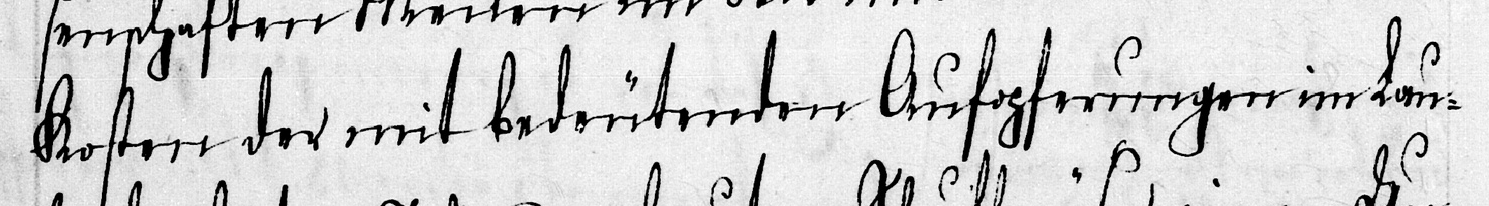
Kosten der mit bedeutenden Aufopferungen im Lau¬
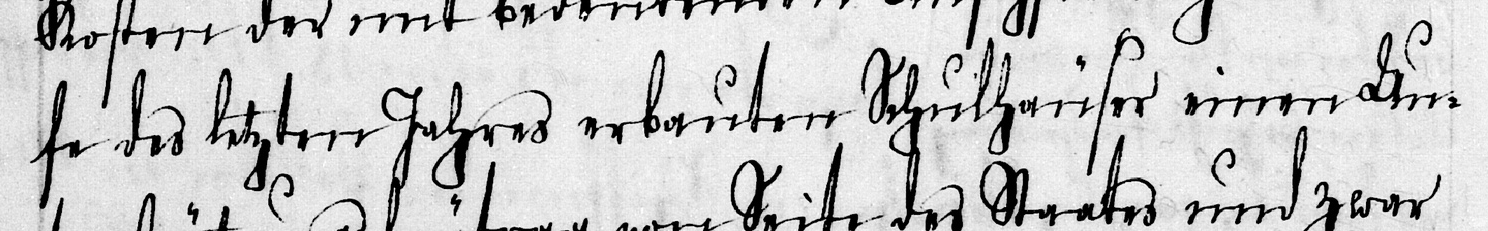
fe des letzten Jahres erbauten Schulhäuser einen Un¬
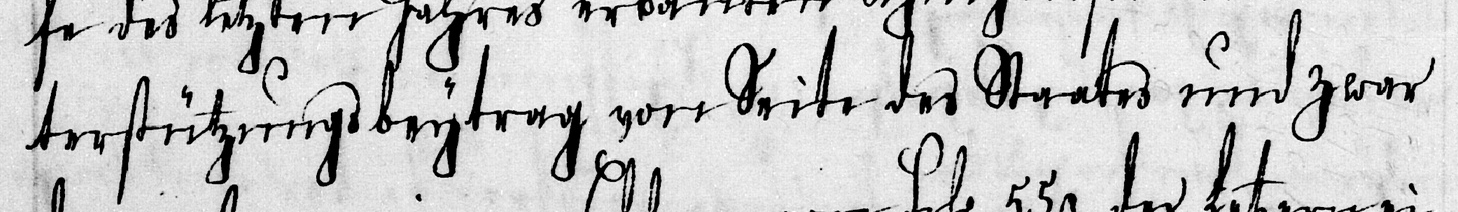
terstützungsbeytrag von Seite des Staates und zwar
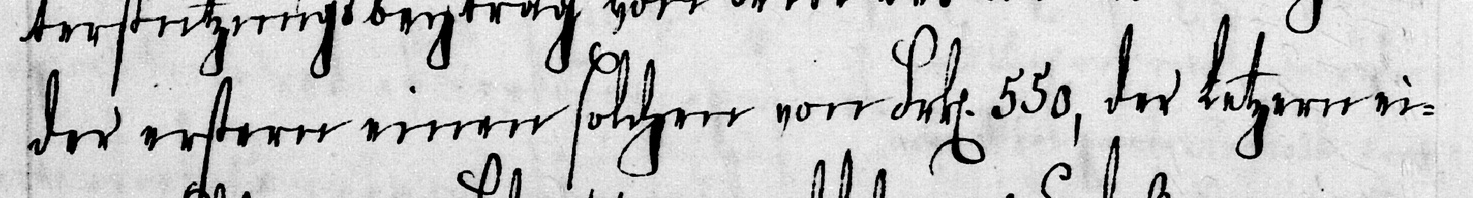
der erstern einen solchen von Frk[en]. 550, der Letztern ein¬
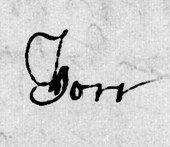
von
